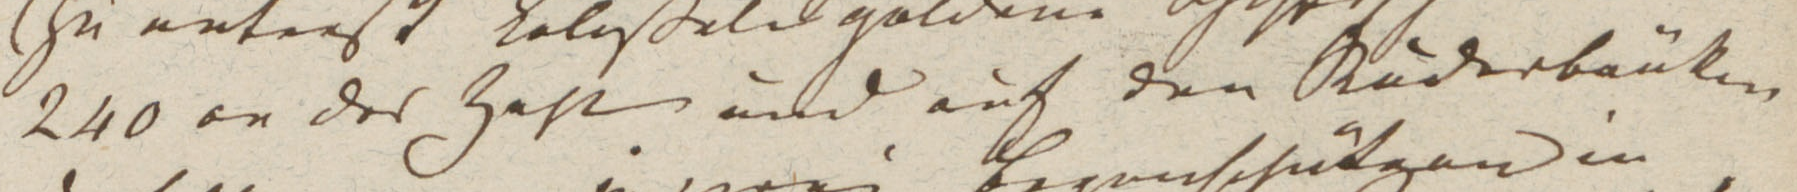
240 an der Zahl und auf den Ruderbänken
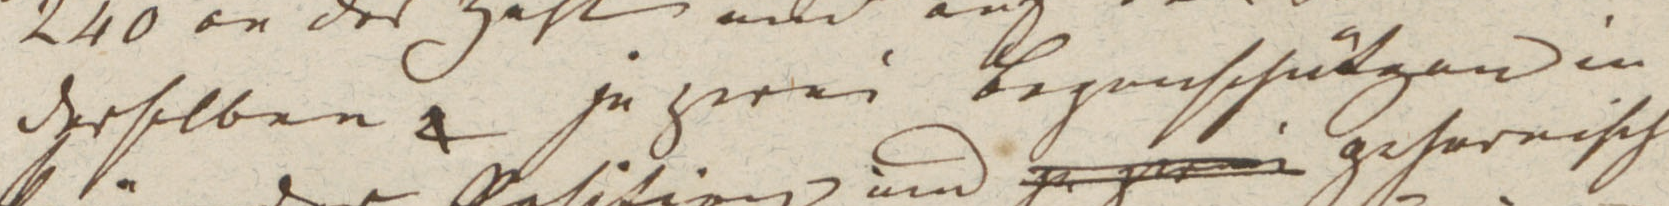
derselben 2 je zwei Bogenschützen in
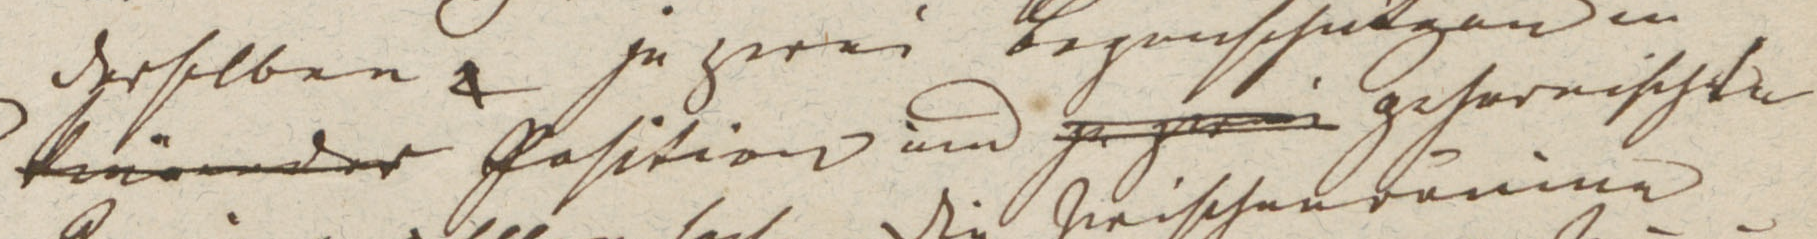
knieender Position und zu zwei geharnischte
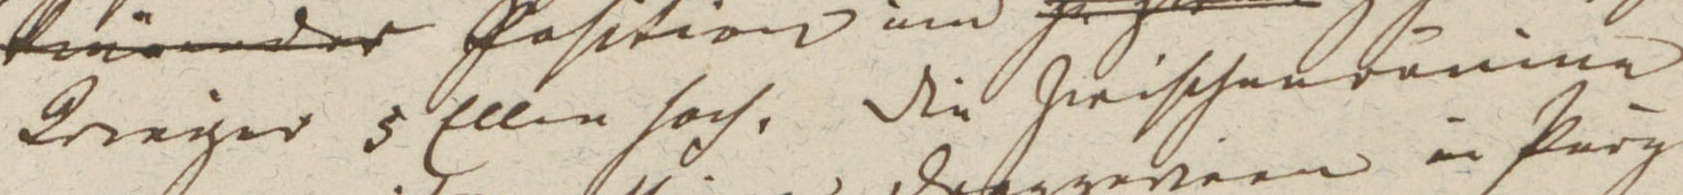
Krieger 5 Ellen hoch. Die Zwischenräume
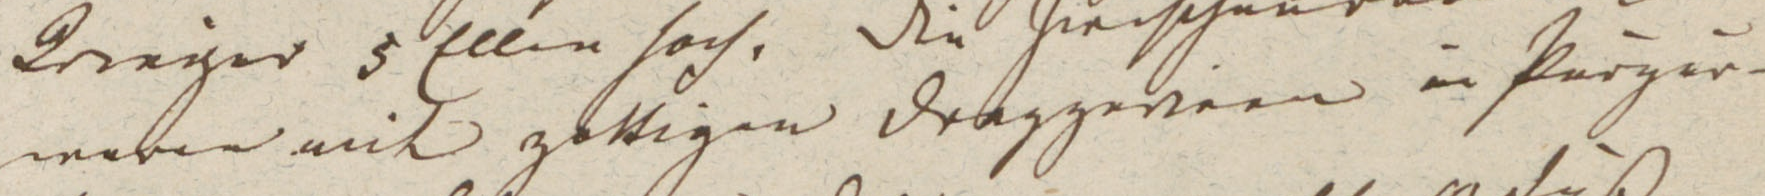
waren mit zottigen Drapperieen in Purpur-
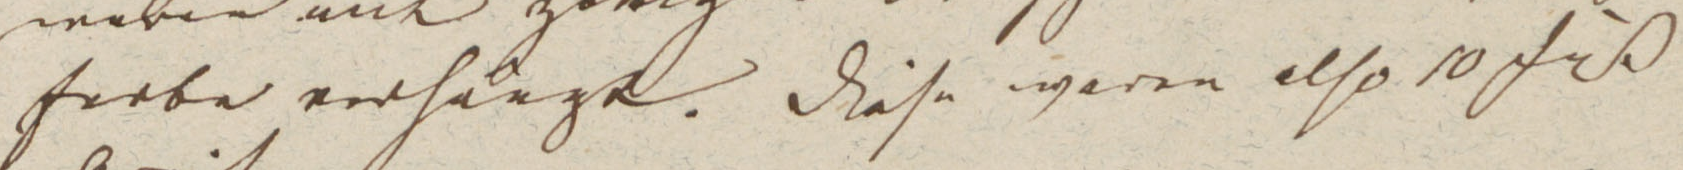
farbe verhängt. Diese waren also 10 Fuss
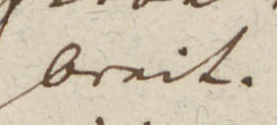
breit.
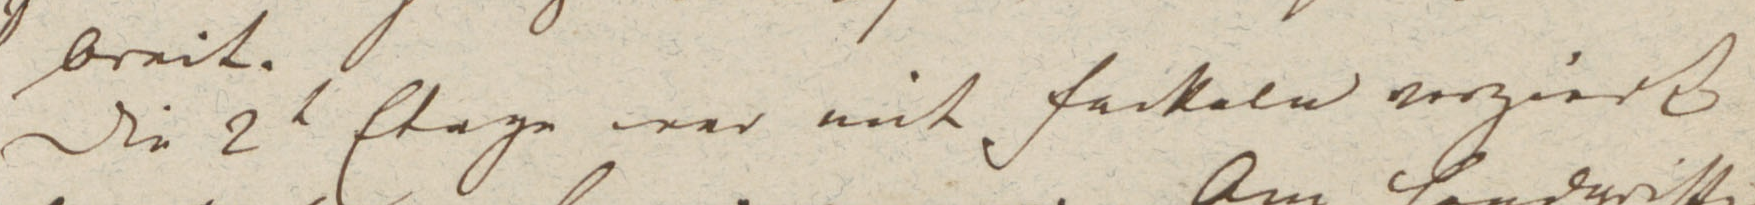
Die 2t Etage war mit Fackeln verziert
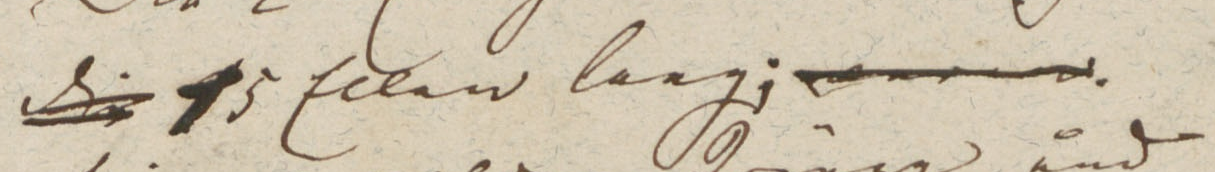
die 5 Ellen lang; waren.
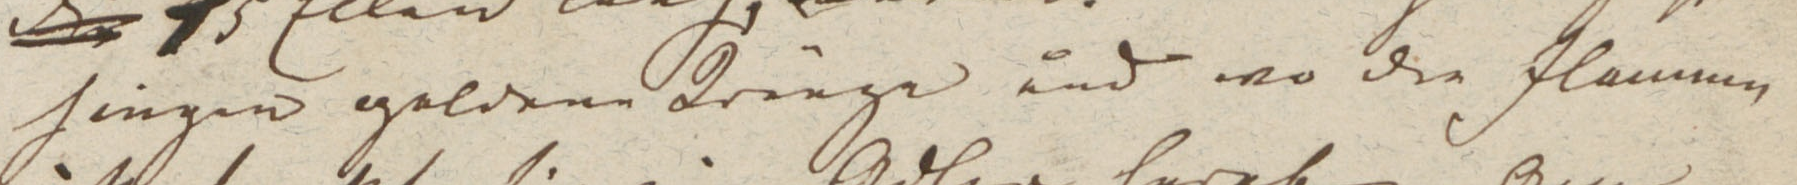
hingen goldene Kränze und wo die Flamme
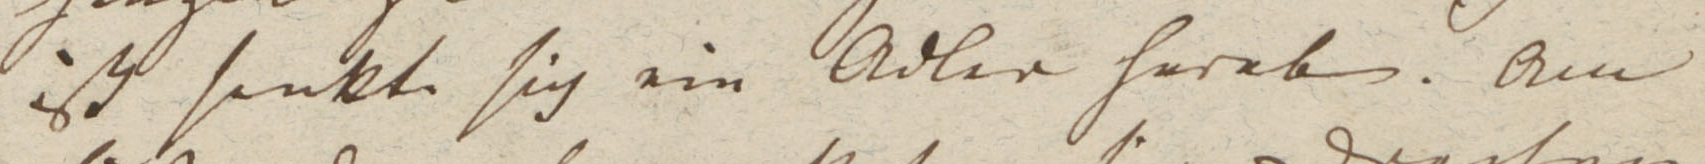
ist senkte sich ein Adler herab. Am
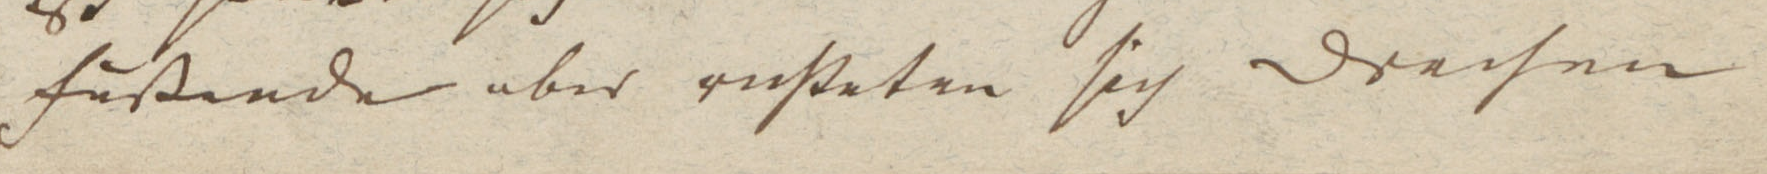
Fussende aber richteten sich Drachen
